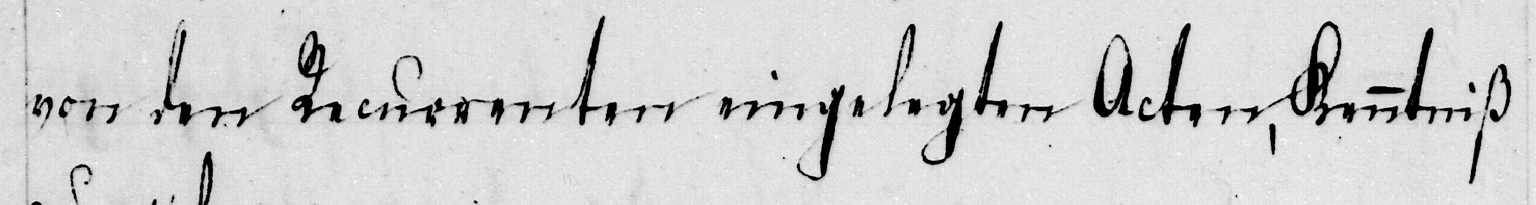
von den Recurrenten eingelegten Acten, Kenntniß
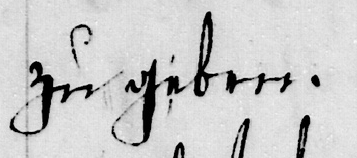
zu geben.
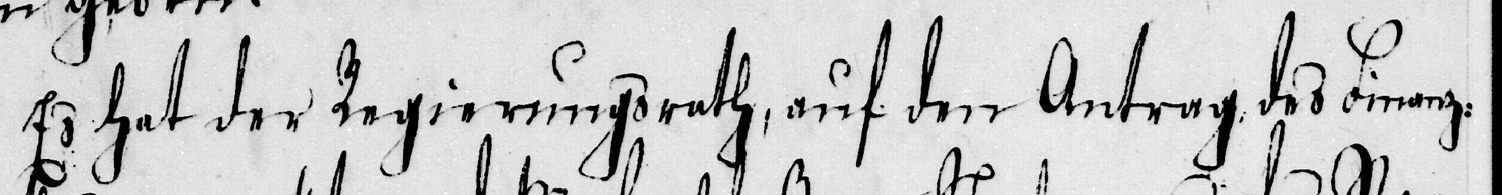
Es hat der Regierungsrath, auf den Antrag des Finanz¬
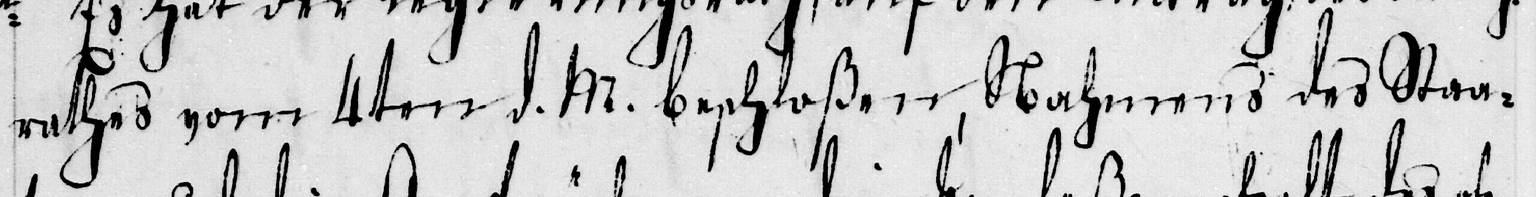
rathes vom 4ten d. M. beschloßen, Nahmens des Staa¬
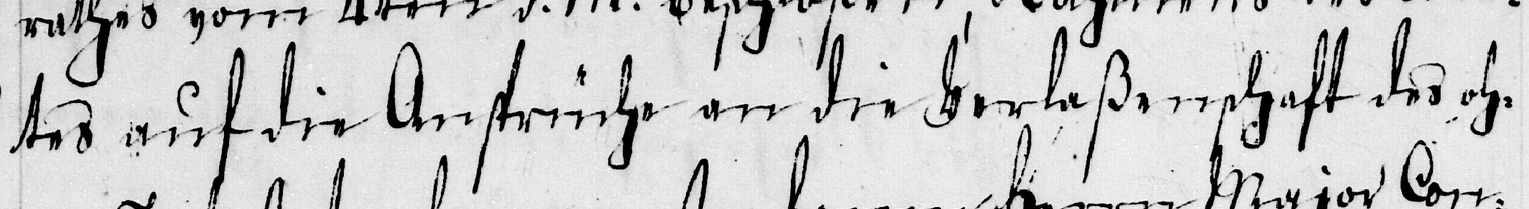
tes auf die Ansprüche an die Verlaßenschaft des oh¬
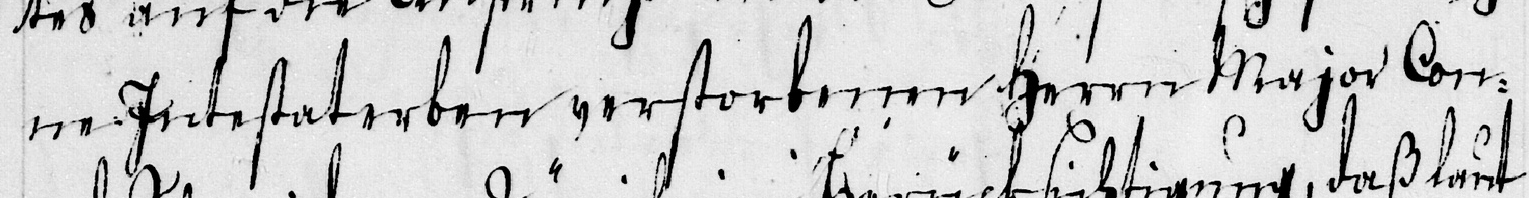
ne Intestaterben verstorbenen Herrn Major Con¬
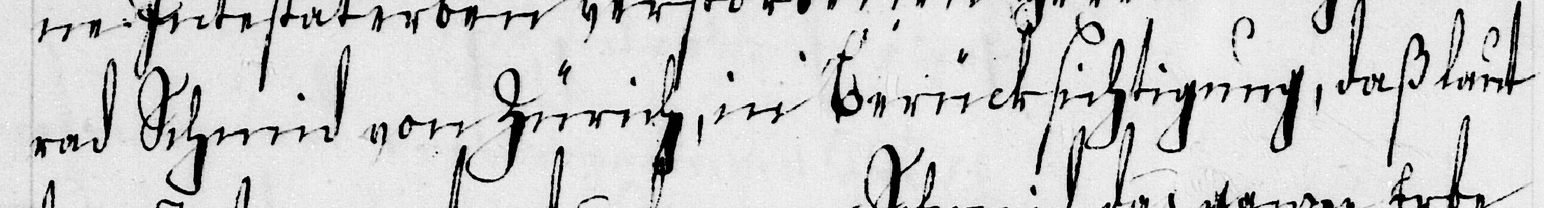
rad Schmid von Zürich, in Berücksichtigung, daß laut
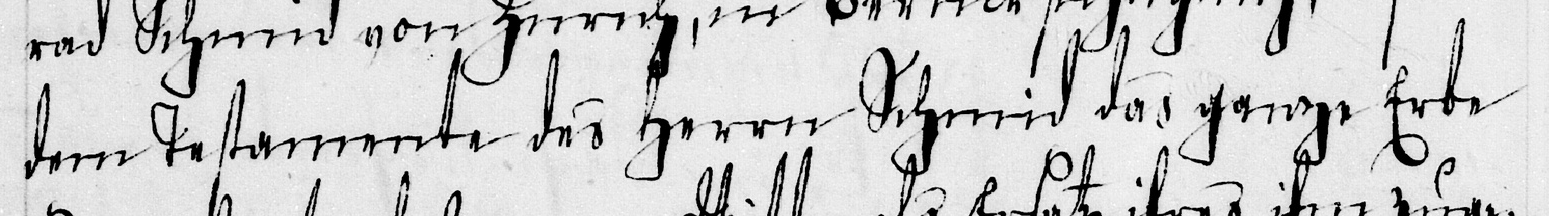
dem Testamente des Herrn Schmid das ganze Erbe
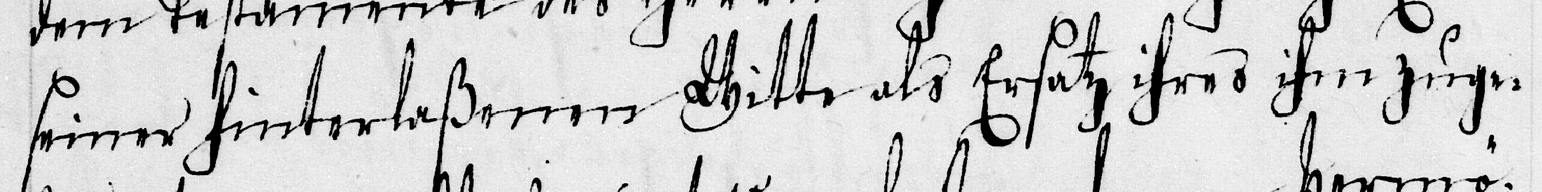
seiner hinterlaßenen Witt[w]e als Ersatz ihres ihm zuge¬
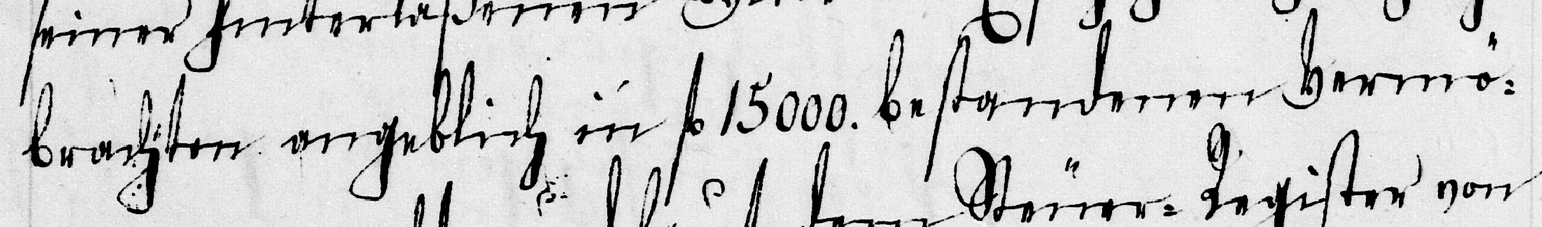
brachten angeblich in fl. 15000. bestehenden Vermö¬
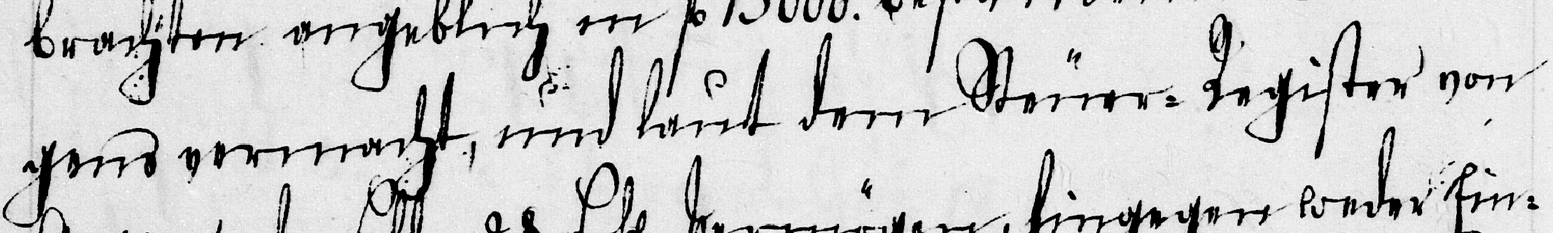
gens vermacht, und laut dem Steuer-Register von
